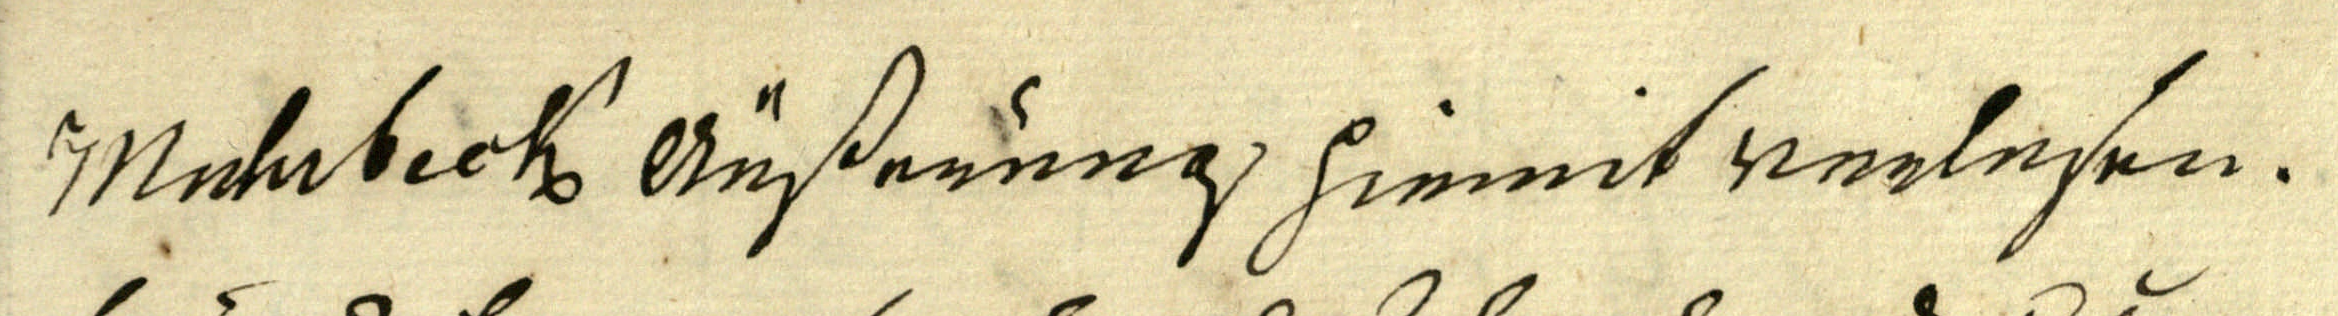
Muhrbeck Äußerung hiemit verlesen.
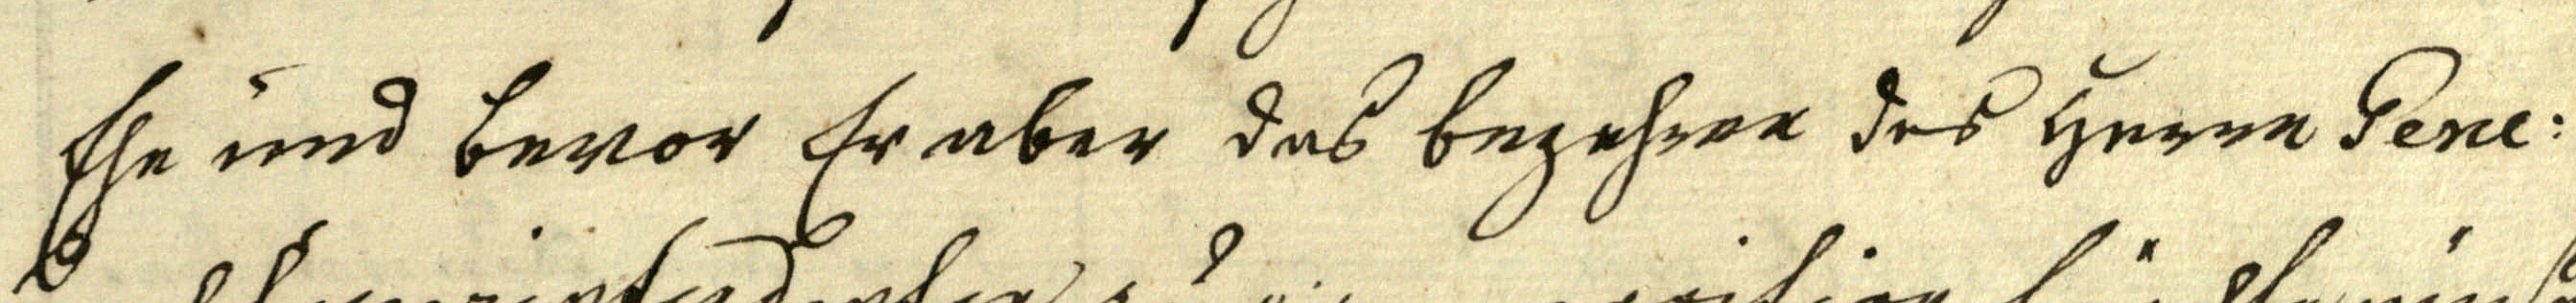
Ehe und bevor Er aber das begehren des Herrn Gene¬
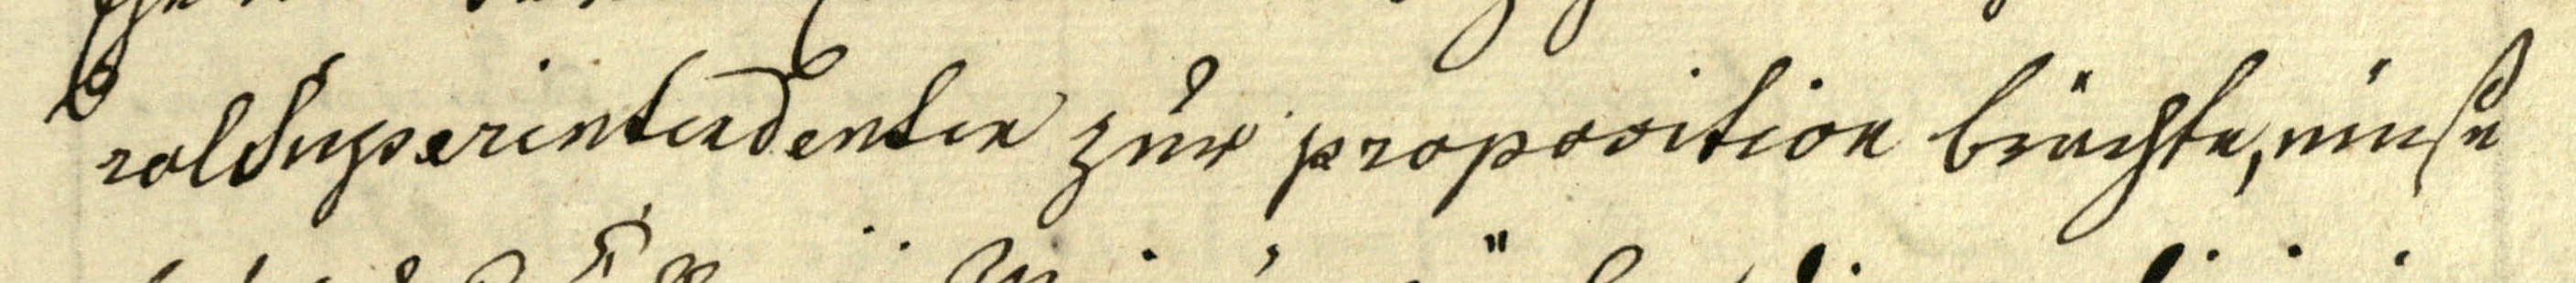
ralSuperintendenten zur proposition brächte, müße
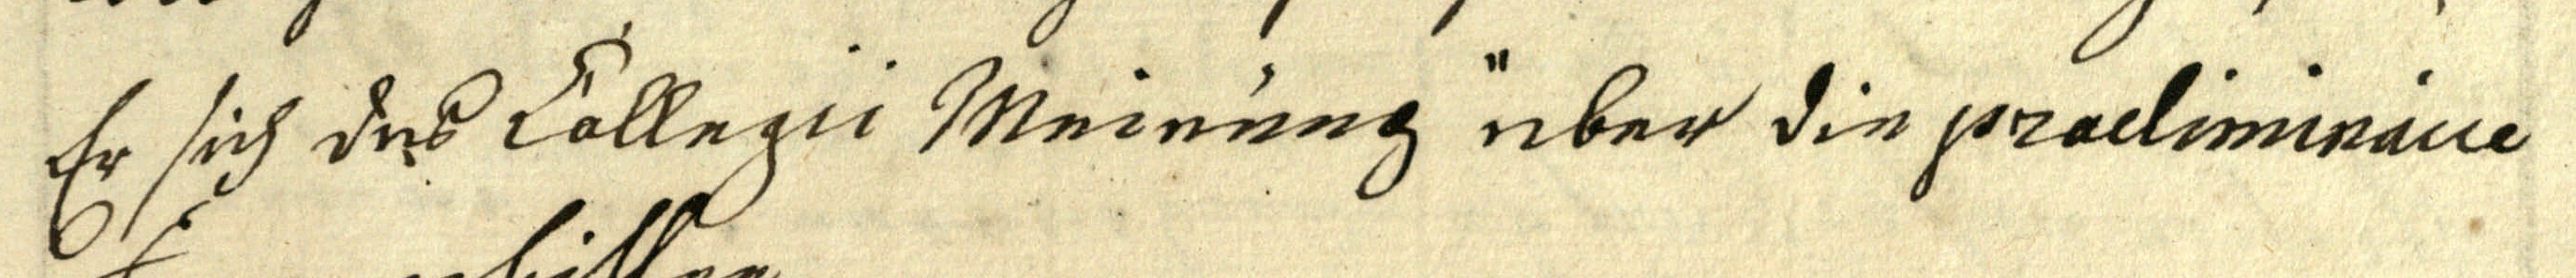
Er sich des Collegii Meinung über die praeliminaire
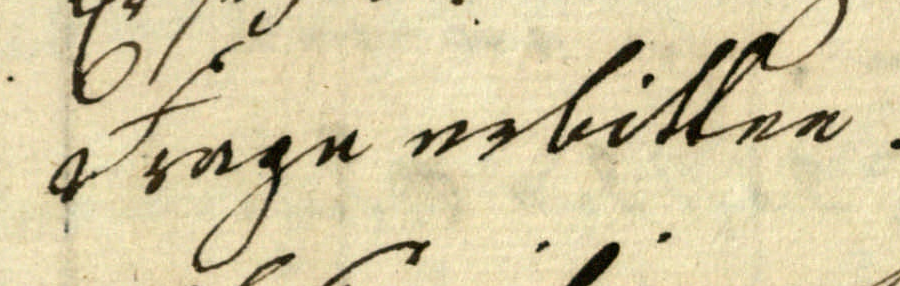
Frage erbitten.
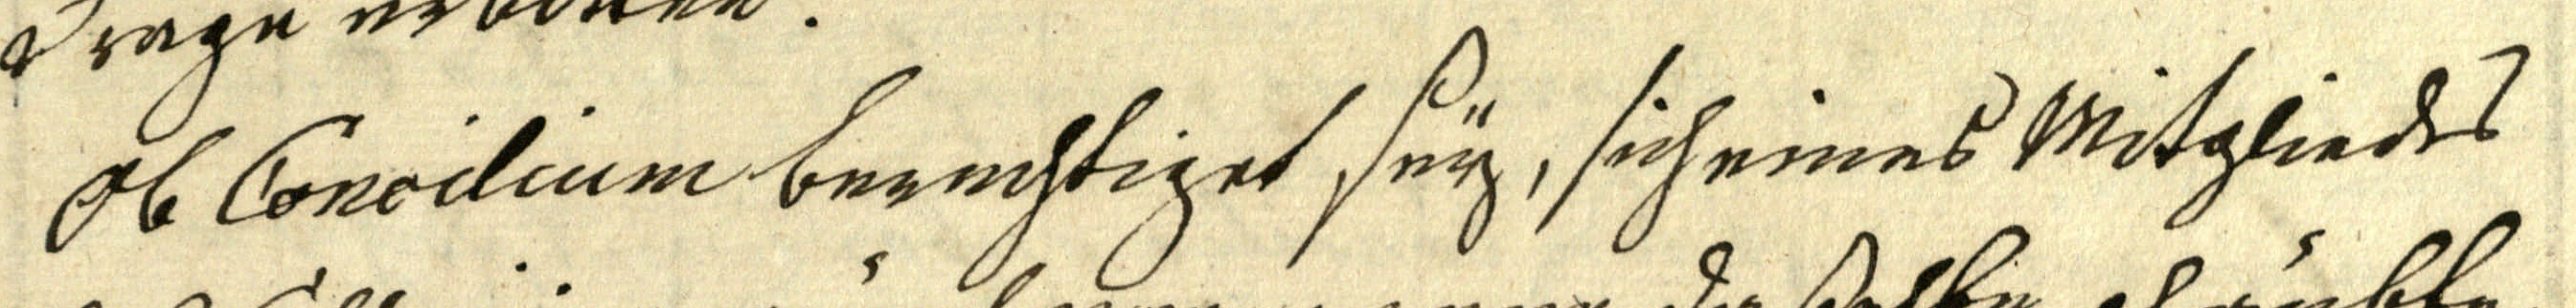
Ob Concilium berechtiget seÿ, sich eines Mitgliedes
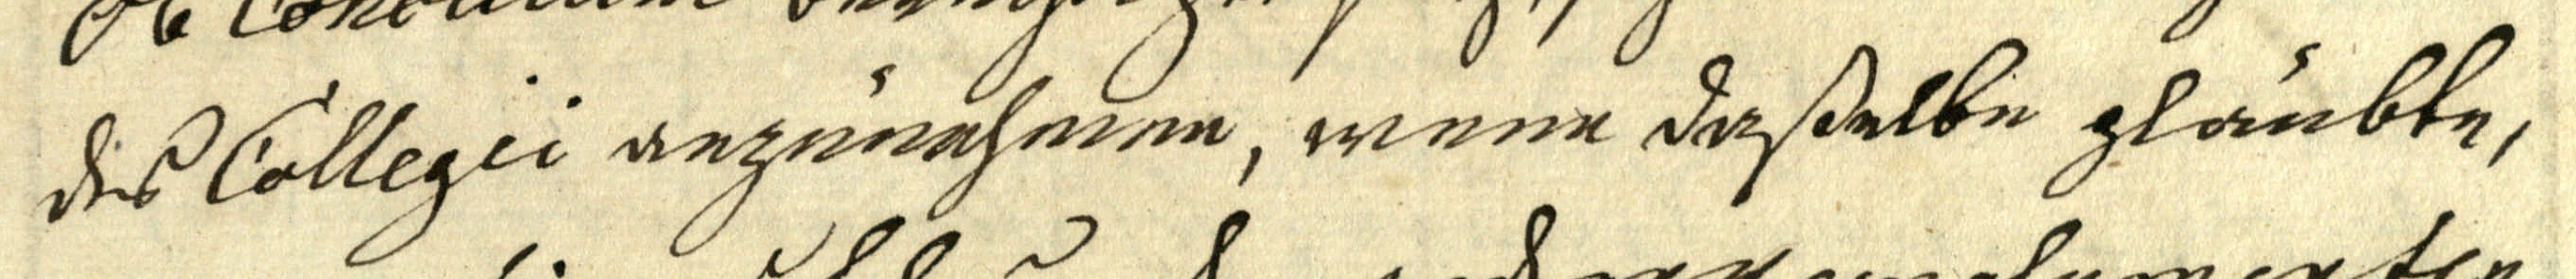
des Collegii anzunehmen, wenn daßelbe glaubte,
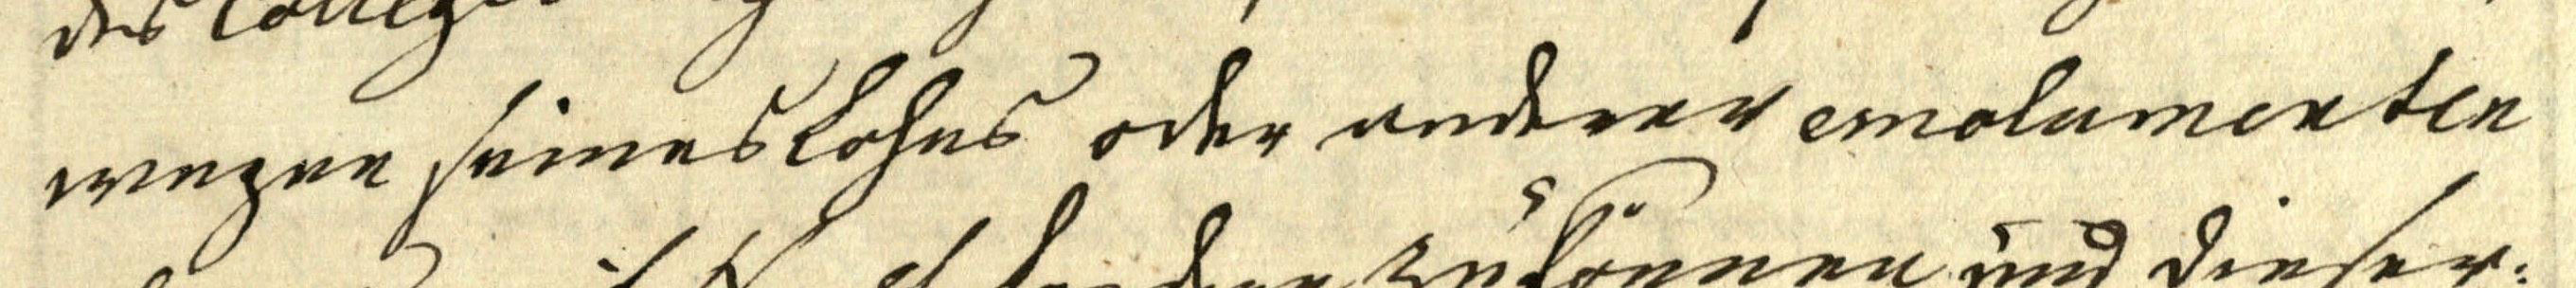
wegen seines Lohns oder anderer emolumenten
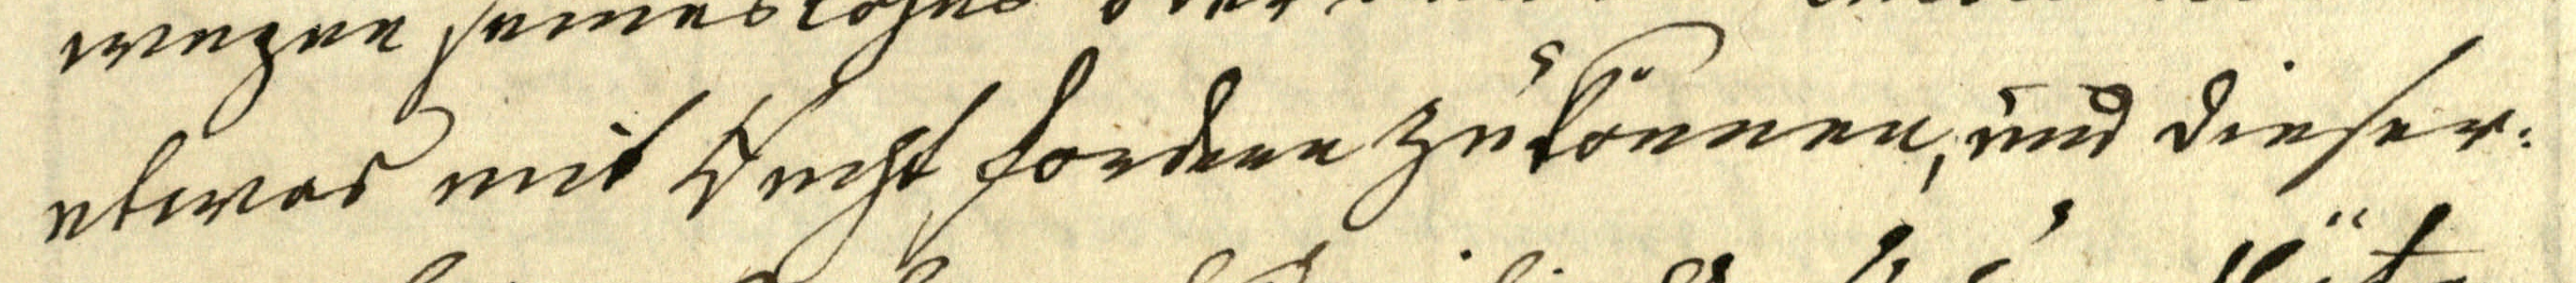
etwas mit Recht fordern zu können, und dieser¬
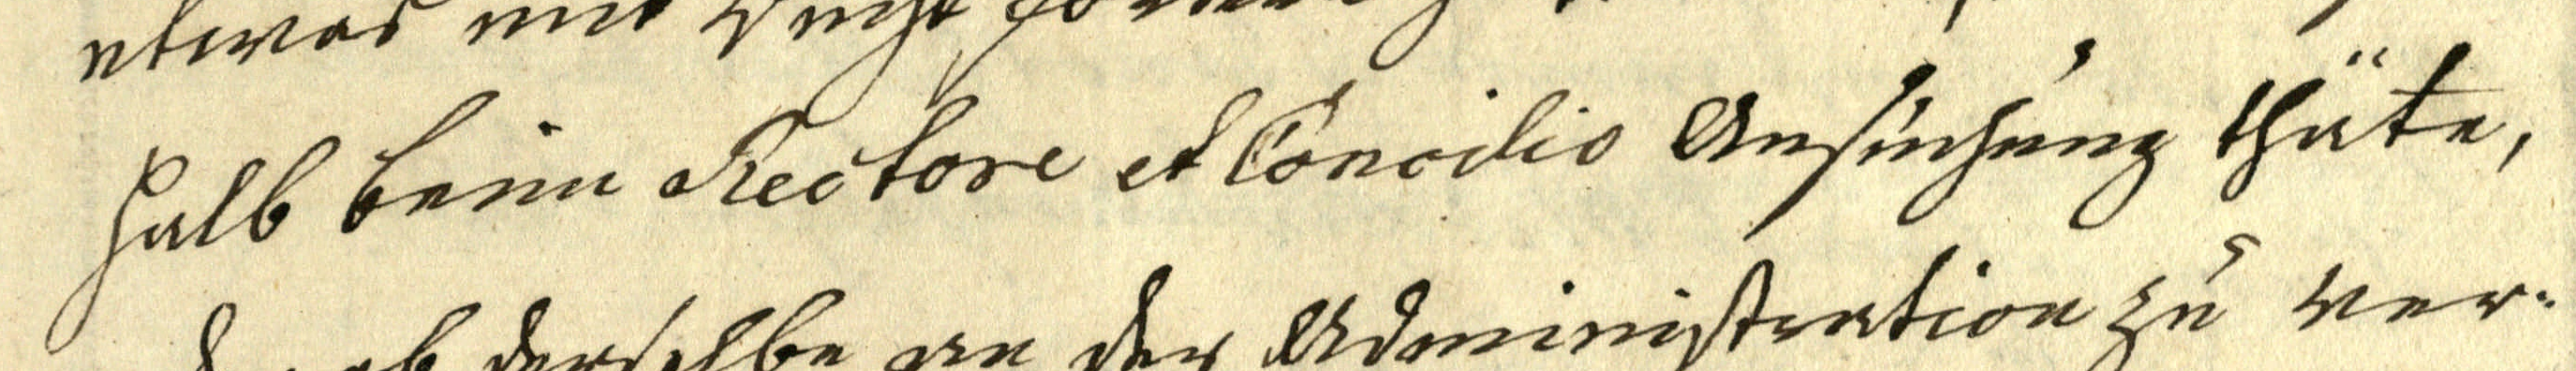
halb beim Rectore et Concilio Ansuchung thäte,
